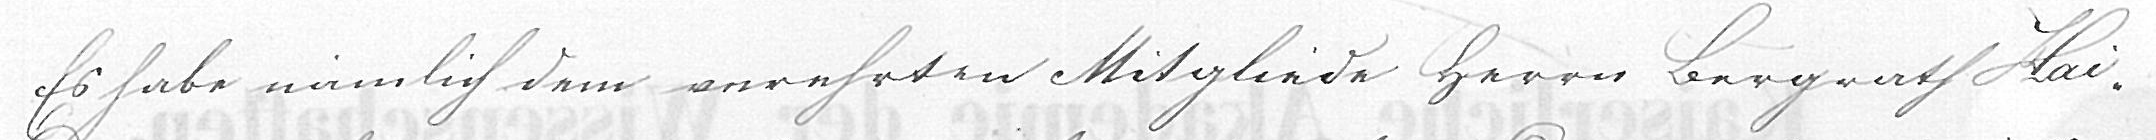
Es habe nämlich dem verehrten Mitgliede Herrn Bergarth Hai-
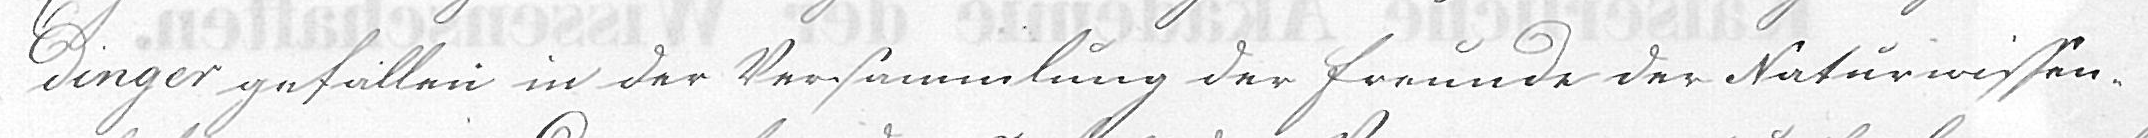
dinger gefallen in der Versammlung der Freunde der Naturwissen-
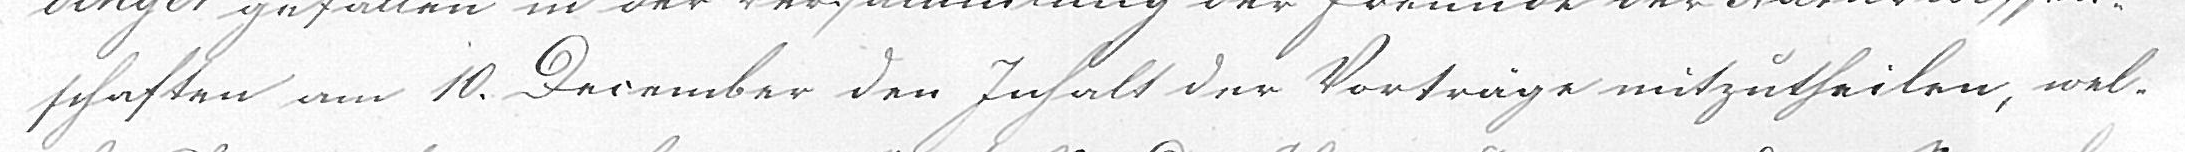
schaften am 10. December den Inhalt der Vorträge mitzutheilen, wel-
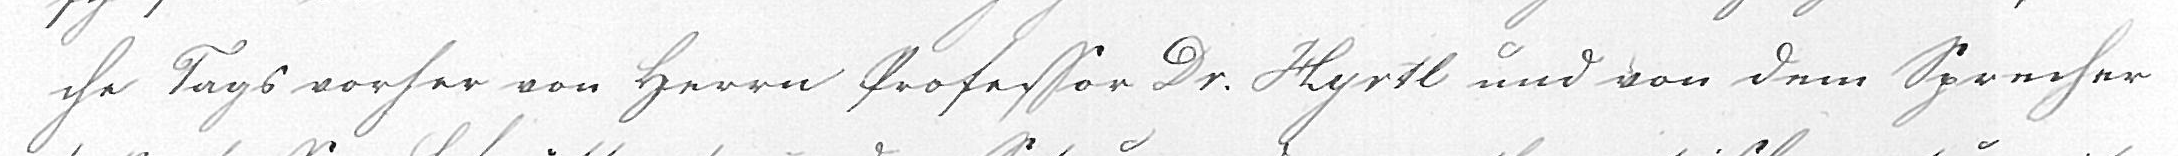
che Tags vorher von Herrn Professor Dr. Hyrtl und von dem Sprecher
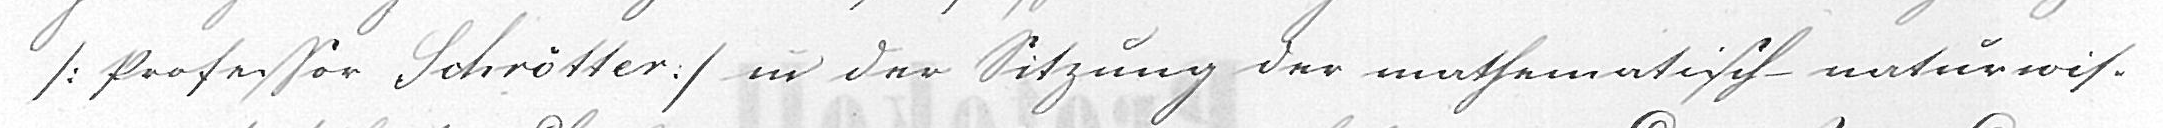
/: Professor Schrötter :/ in der Sitzung der mathmatisch-naturwis.
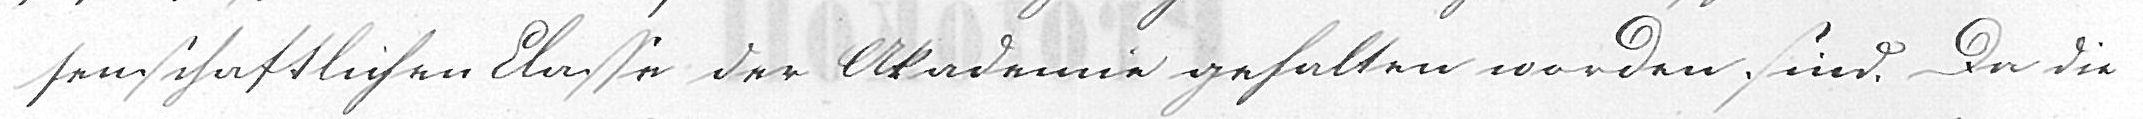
senschaftlichen Classe der Akademie gehalten worden ind. Da die
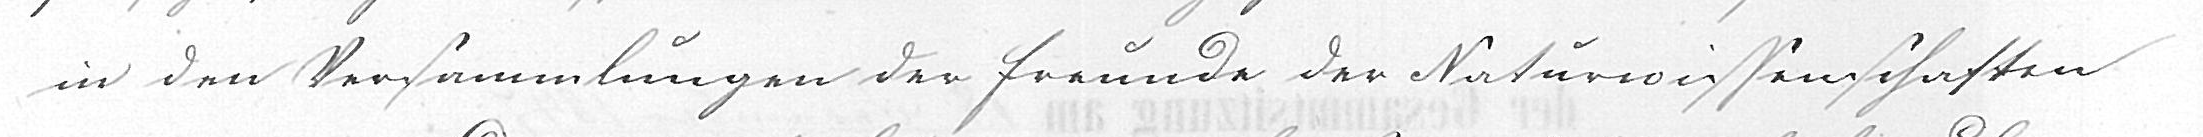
in den Versammlungen der Freunde der Naturwissenschaften
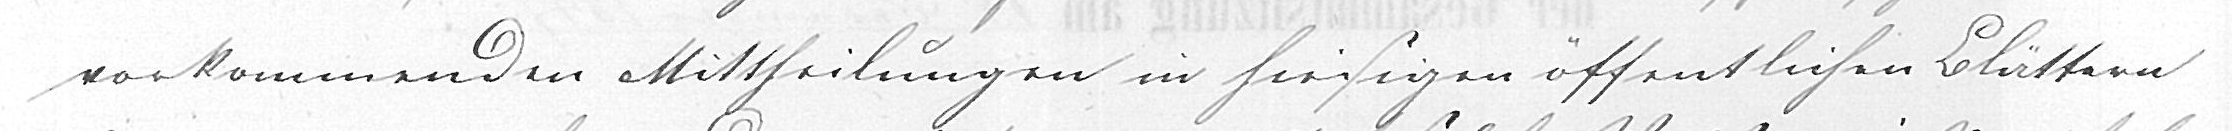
vorkommenden Mitthelungen in hiesigem öffentlichen Blättern
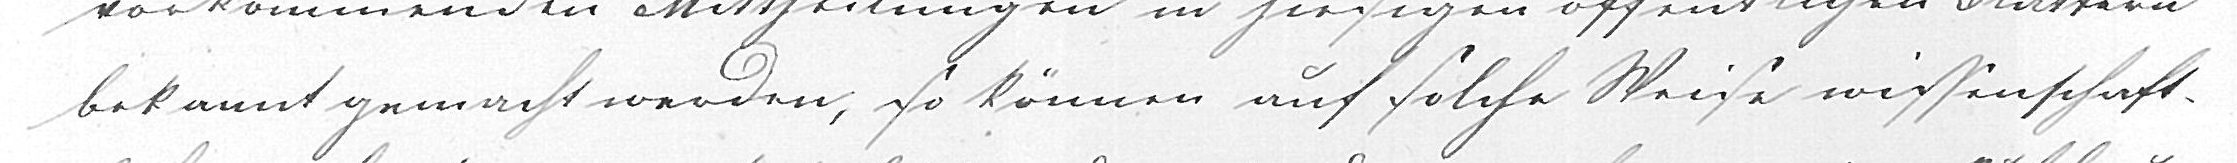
bekannt gemacht werden, so können auf solche Weise wissenschaft-
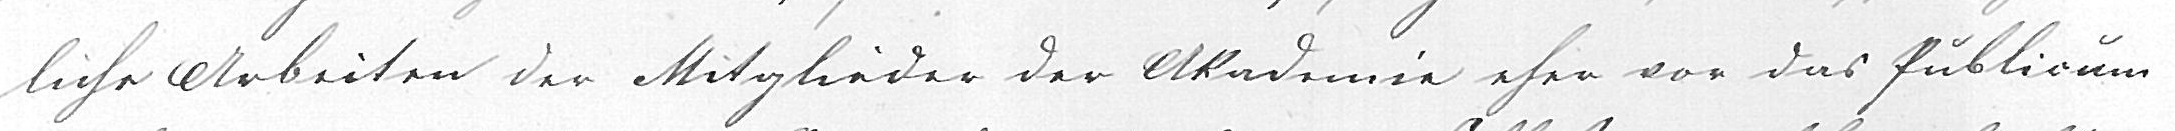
liche Arbeiten der Mitglieder der Akademie eher vor das Publicum
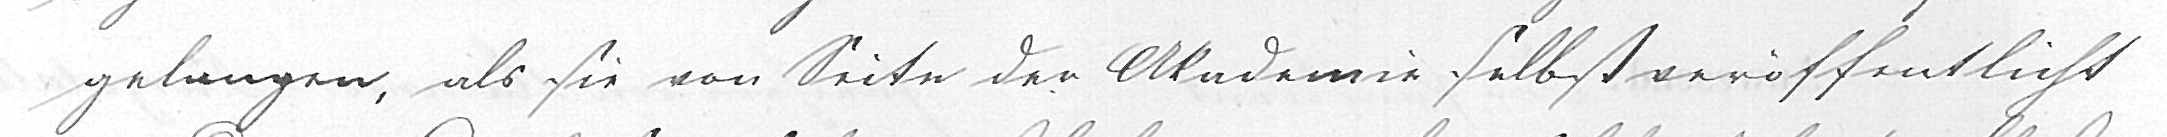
gelangen, als sie von Seite der Akademie selbst veröffentlicht
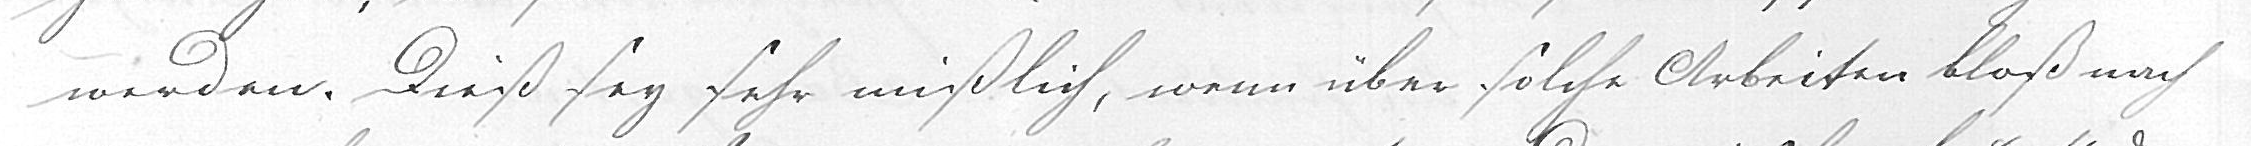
werden. Dieß sey sehr mißlich, wenn über solche Arbeiten bloß nach
